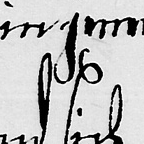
gie¬
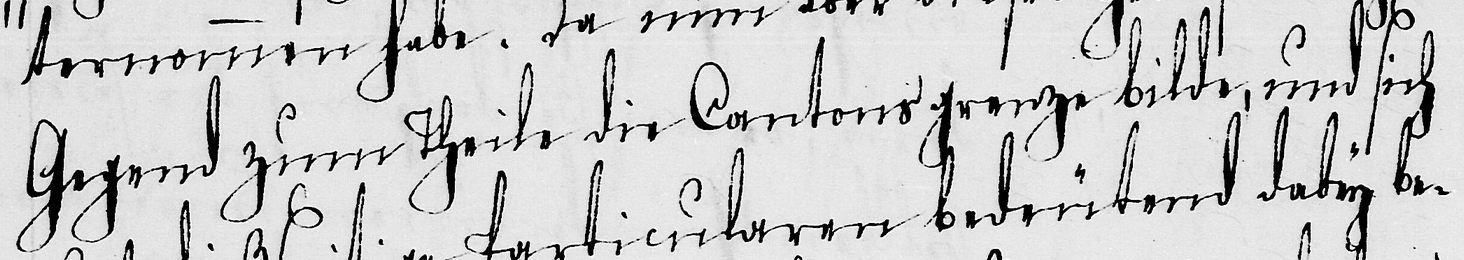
Gegend zum Theile die Cantonsgrenze bilde, und sich
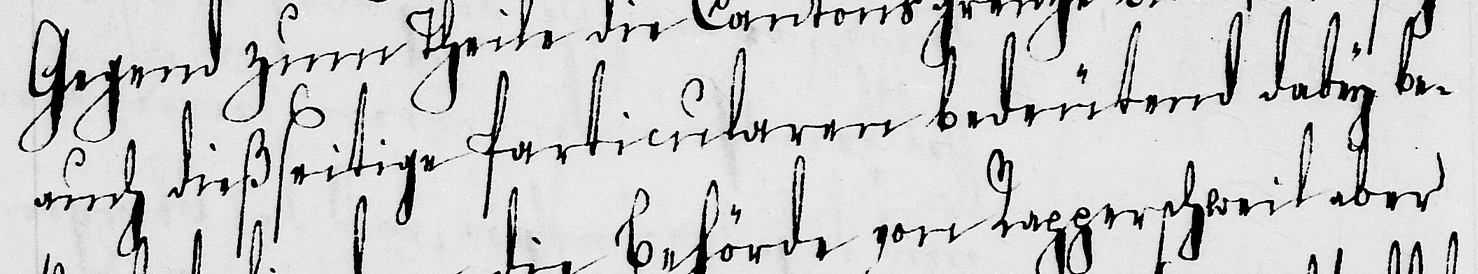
auch dießseitige Particularen bedeutend dabey b¬
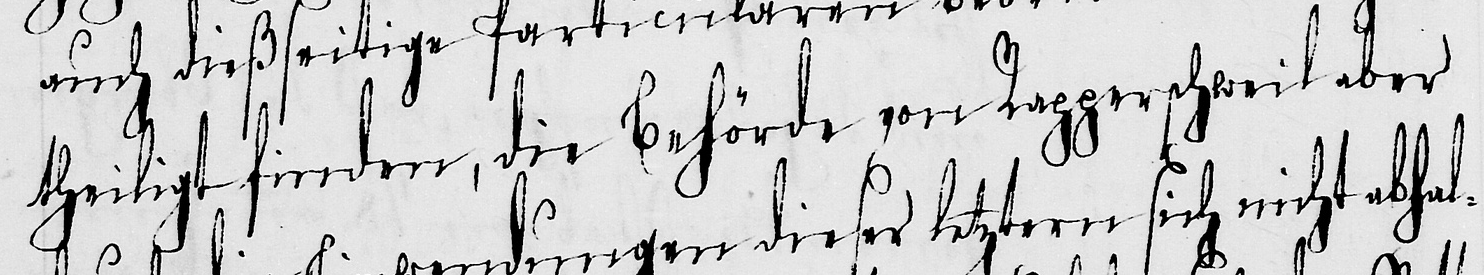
theiligt finden, die Behörde von Rapperschweil aber
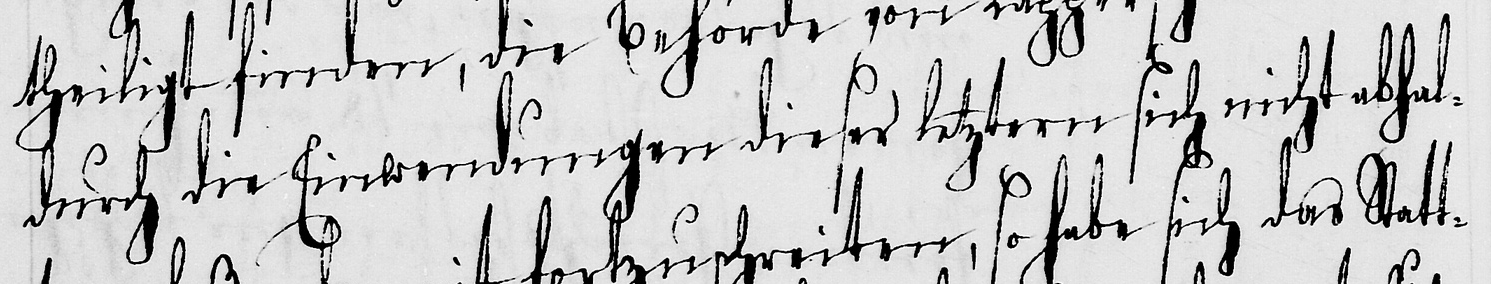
durch die Einwendungen dieser letztern sich nicht
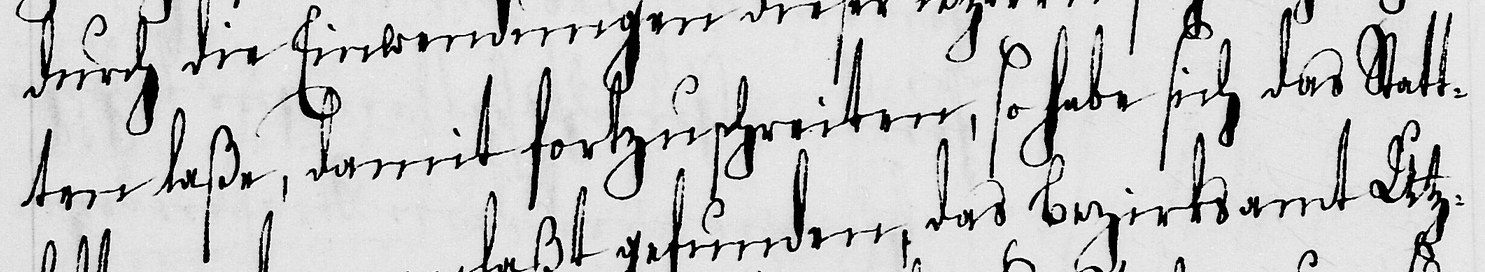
ten laße, damit fortzuschreiten, so habe sich das Stat¬
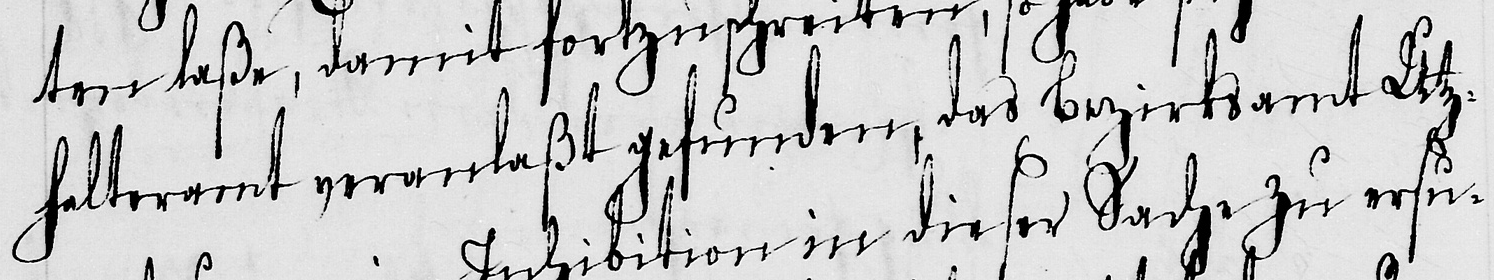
thalteramt veranlaßt gefunden, das Bezirksamt Utz¬
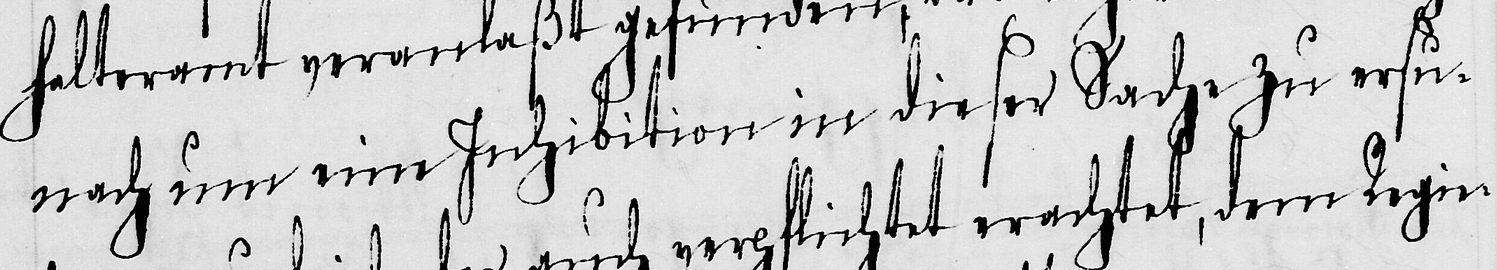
nach um eine Inhibition in dieser Sache zu ersu¬
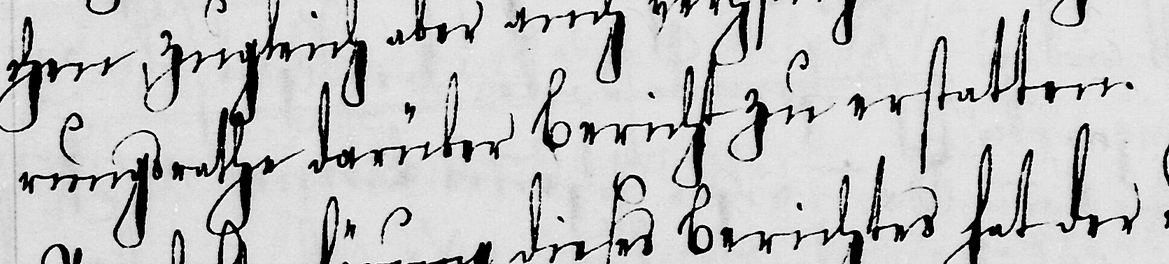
rungsrathe darüber Bericht zu erstatten.
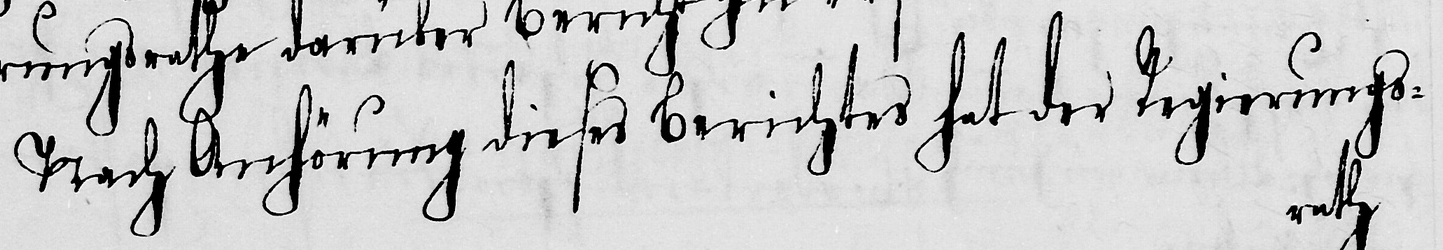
Nach Anhörung dieses Berichtes hat der Regierungs-
